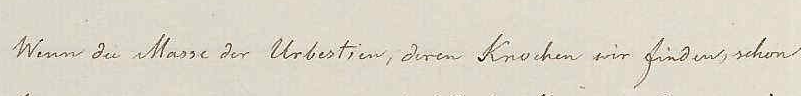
Wenn die Masse der Urbestien, deren Knochen wir finden, schon
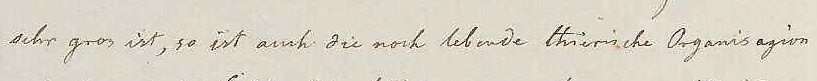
sehr gros ist, so ist auch die noch lebende thierische Organisazion
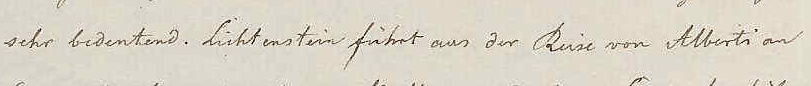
sehr bedeutend. Lichtenstein führt aus der Reise von Alberti an
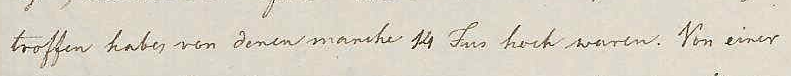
troffen habe, von denen manche 14 Fus hoch waren. Von einer
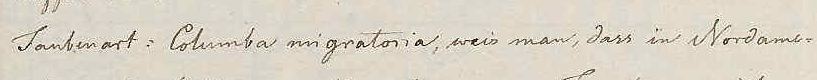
Taubenart: Columba migratoria, weis man, dass in Nordame-
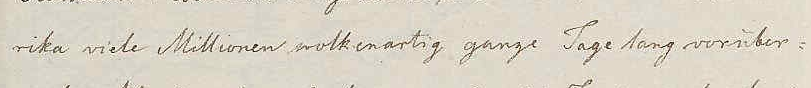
rika viele Millionen wolkenartig ganze Tage lang vorüber-
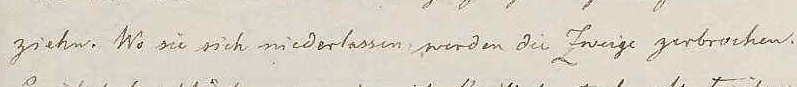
ziehn. Wo sie sich niederlassen, werden die Zweige zerbrochen.
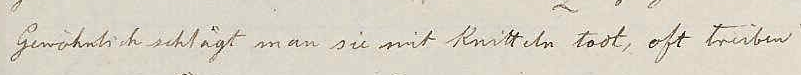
Gewöhnlich schlägt man sie mit Knitteln todt, oft treiben
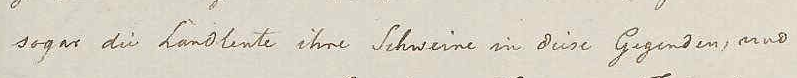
sogar die Landleute ihre Schweine in diese Gegenden, und
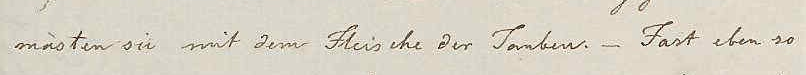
mästen sie mit dem Fleische der Tauben. – Fast eben so
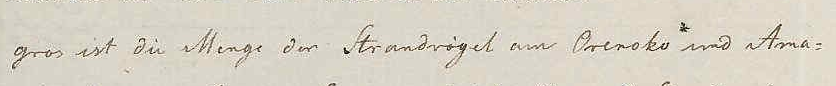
gros ist die Menge der Strandvögel am Orenoko und Ama-
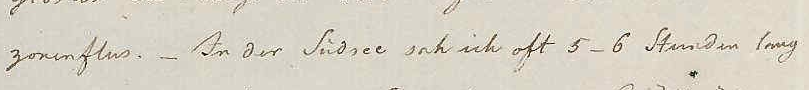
zonenflus. – In der Südsee sah ich oft 5–6 Stunden lang
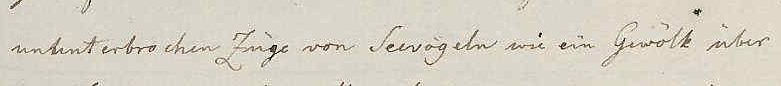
untunterbrochen Züge von Seevögeln wie ein Gewölk über
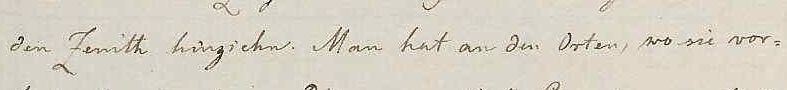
den Zenith hinziehn. Man hat an den Orten, wo sie vor-
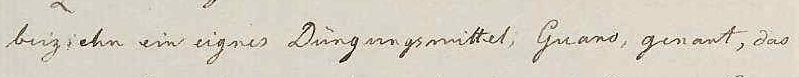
beiziehn ein eignes Düngungsmittel, Guano, genant, das
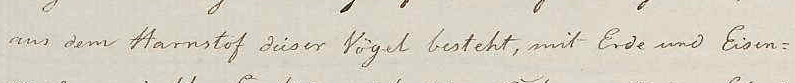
aus dem Harnstof dieser Vögel besteht, mit Erde und Eisen-
